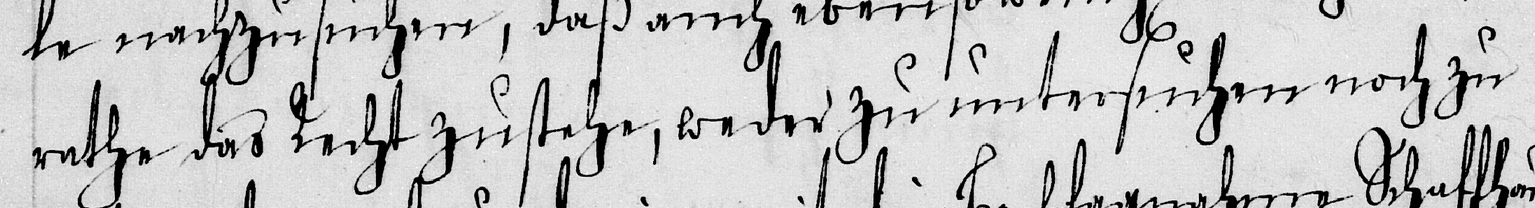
rathe das Recht zustehe, weder zu untersuchen noch zu
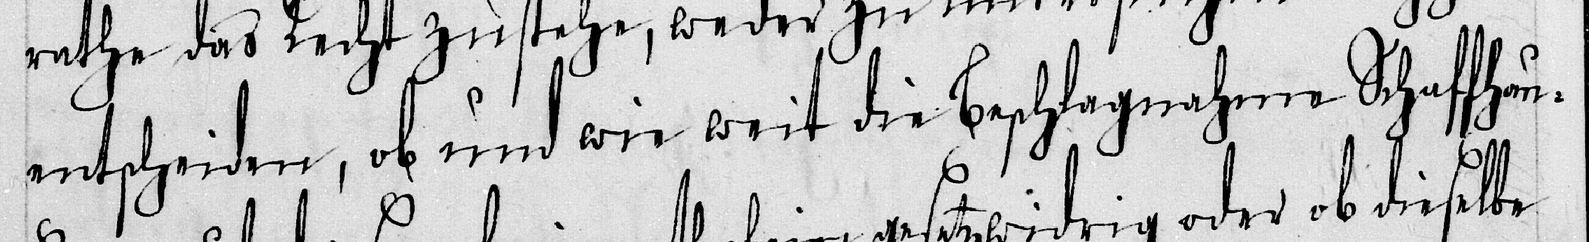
entscheiden, ob und wie weit die Beschlagnahme Schaffhau¬
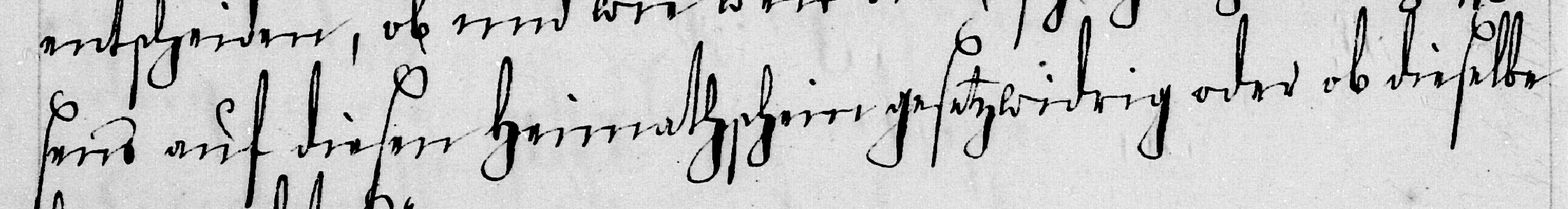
sens auf diesen Heimathschein gesetzwidrig oder ob dieselbe
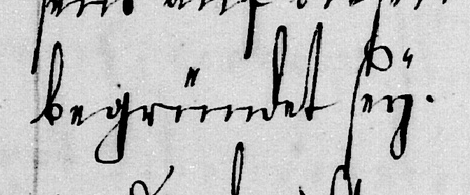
begründet sey.
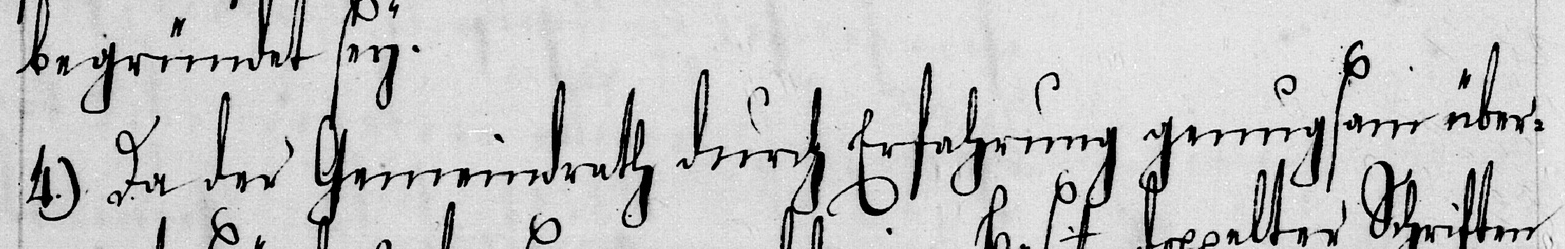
4.) Da der Gemeindrath durch Erfahrung genugsam über¬
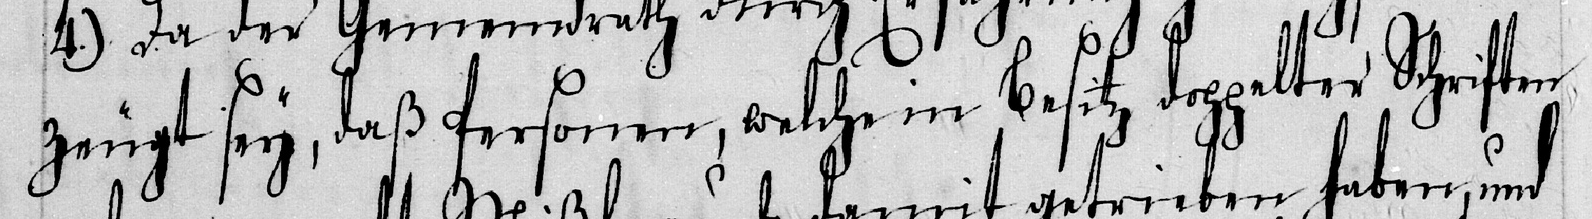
zeugt sey, daß Personen, welche in Besitz doppelter Schrift¬
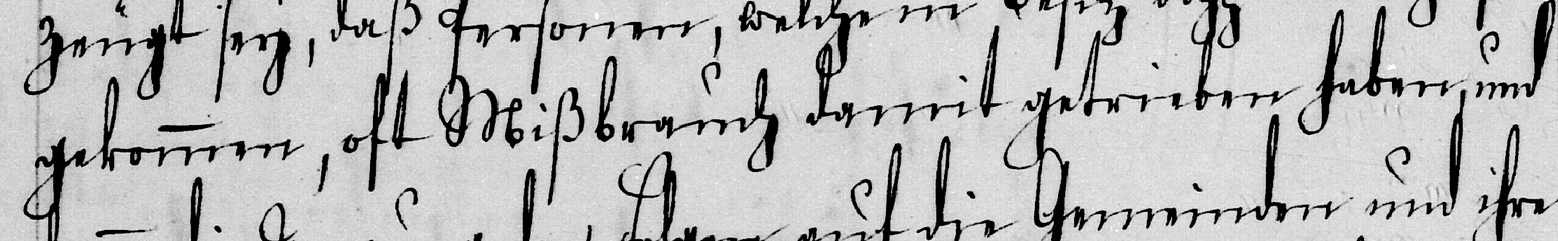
gekommen, oft Mißbrauch damit getrieben haben, und
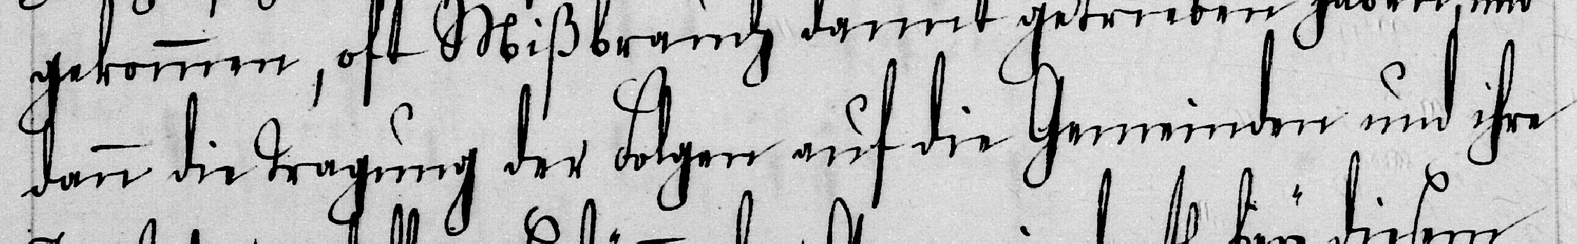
dann die Tragung der Folgen auf die Gemeinden und ihre
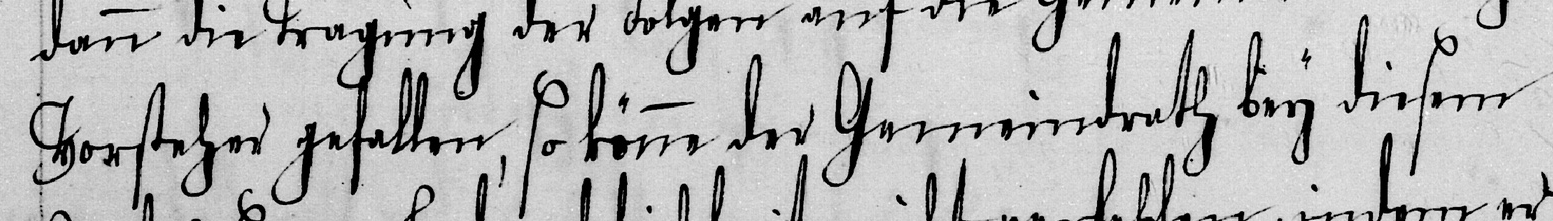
Vorsteher gefallen, so könne der Gemeindrath bey diesem
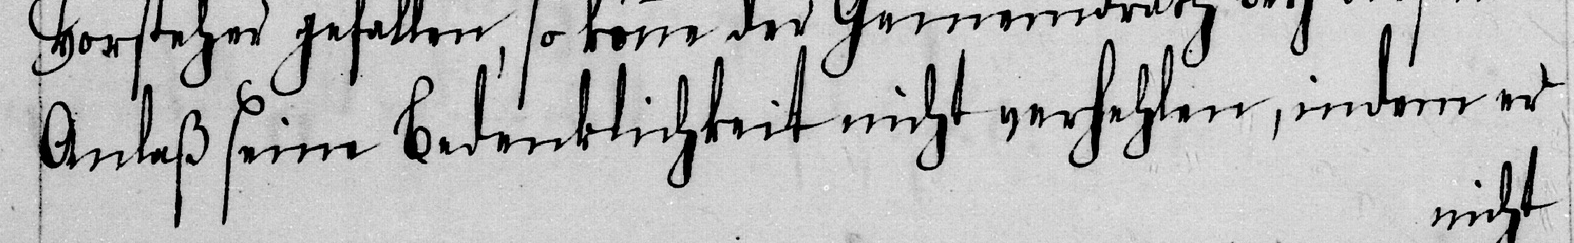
Anlaß seine Bedenklichkeit nicht verhehlen, indem er
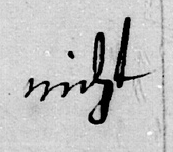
nicht
